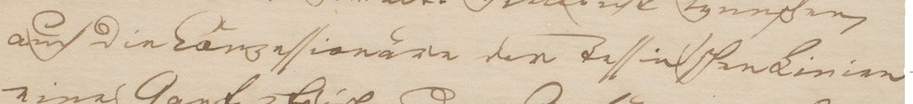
auch die Conzessionäre der Tessin'schen Linien
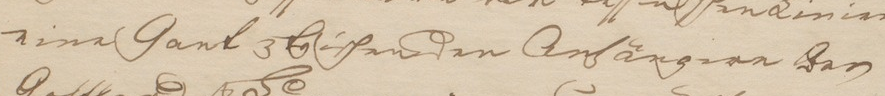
eine Gant zwischen den Anhängern des
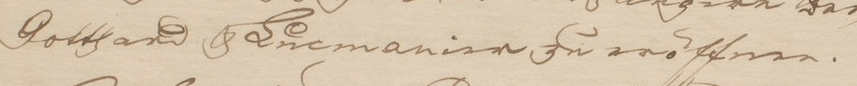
Gotthard & Lucmanier zu eröffnen.
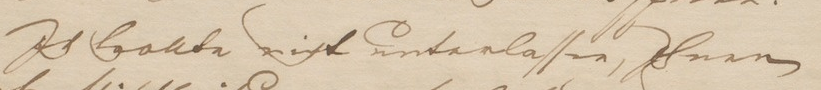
Ich werde nicht unterlassen, Ihnen
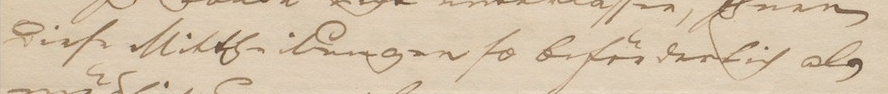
diese Mittheilungen so beförderlich als
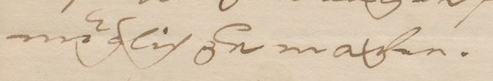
möglich zu machen.
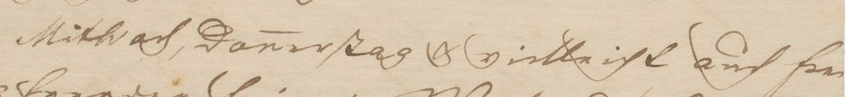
Mittwoch, Donnerstag, & vielleicht auch Frei-
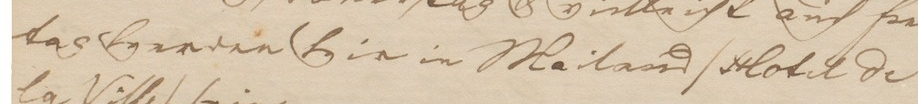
tag werden wir in Mailand /Hotel de
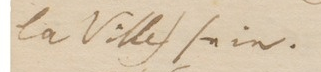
la Ville/ sein.
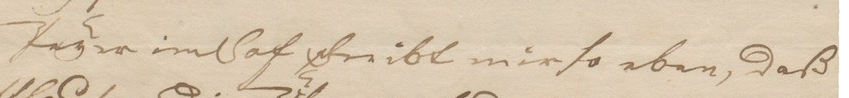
Peyer im Hof schreibt mir so eben, daß
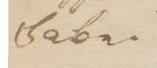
habe.
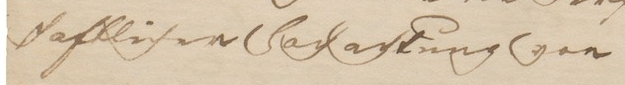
schaftlicher Hochachtung von
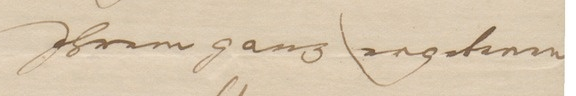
Ihrem ganz ergebenen
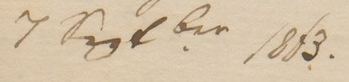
7 Septber 1863.
